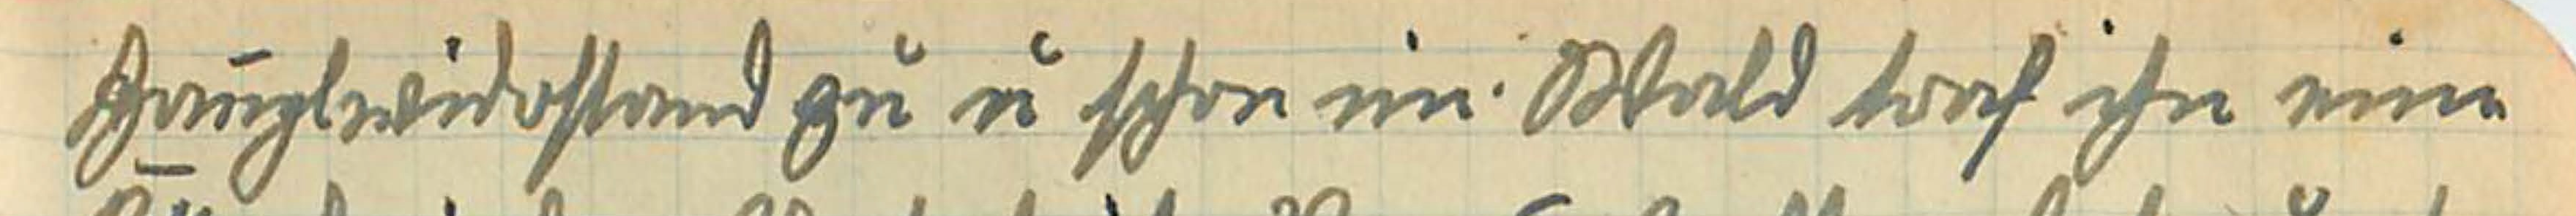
Hauptwiderstand zu u schon im Wald traf ihn eine
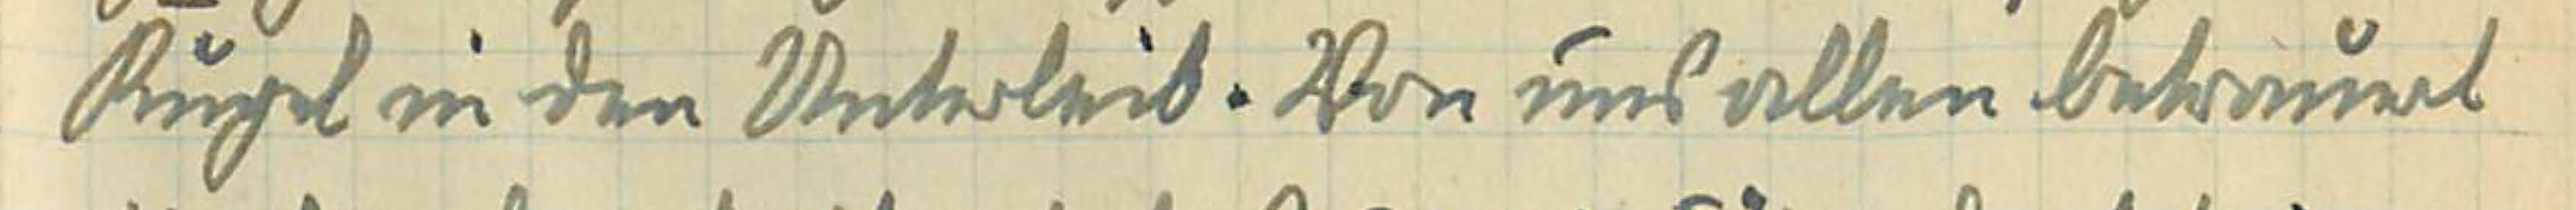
Kugel in den Unterleib. Von uns allen betrauert
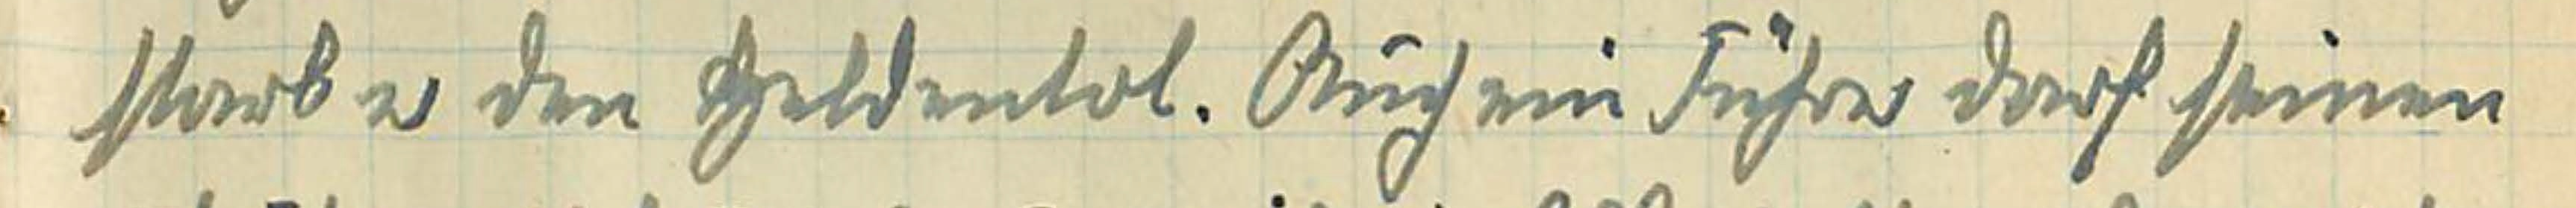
starb er den Heldentot. Auch ein Führer darf seinen
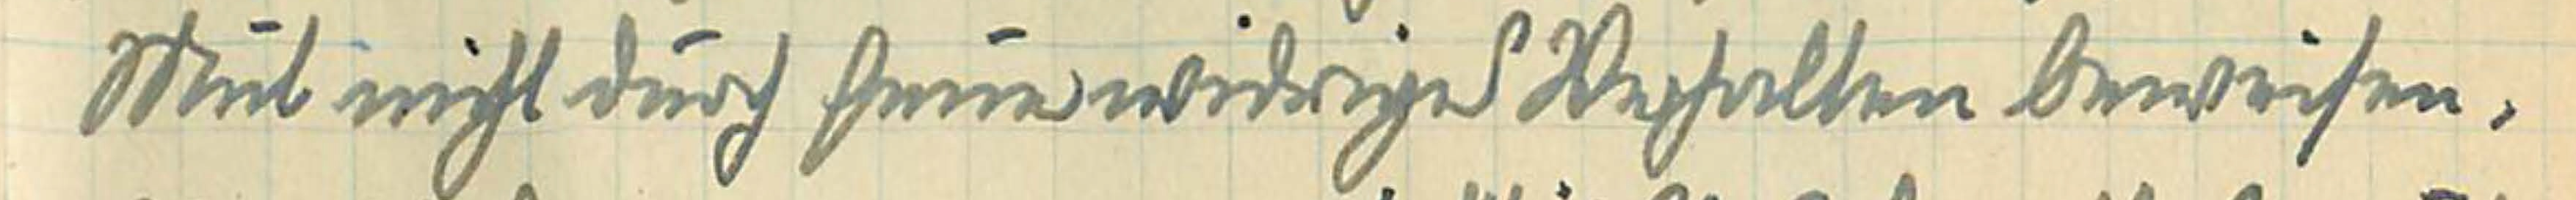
Mut nicht durch feuerwidriges Verhalten beweisen.
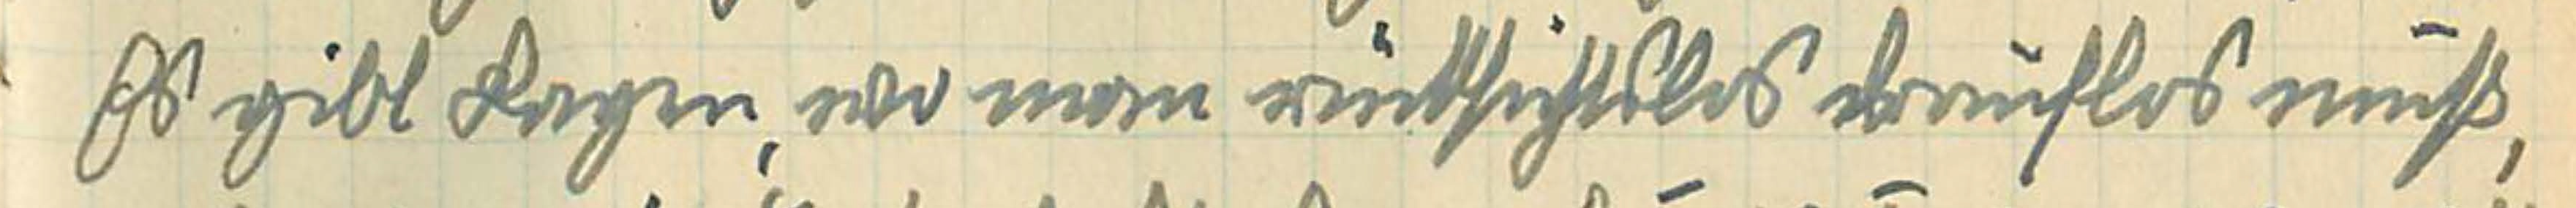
Es gibt Lagen, wo man rücksichtslos drauflos muß,
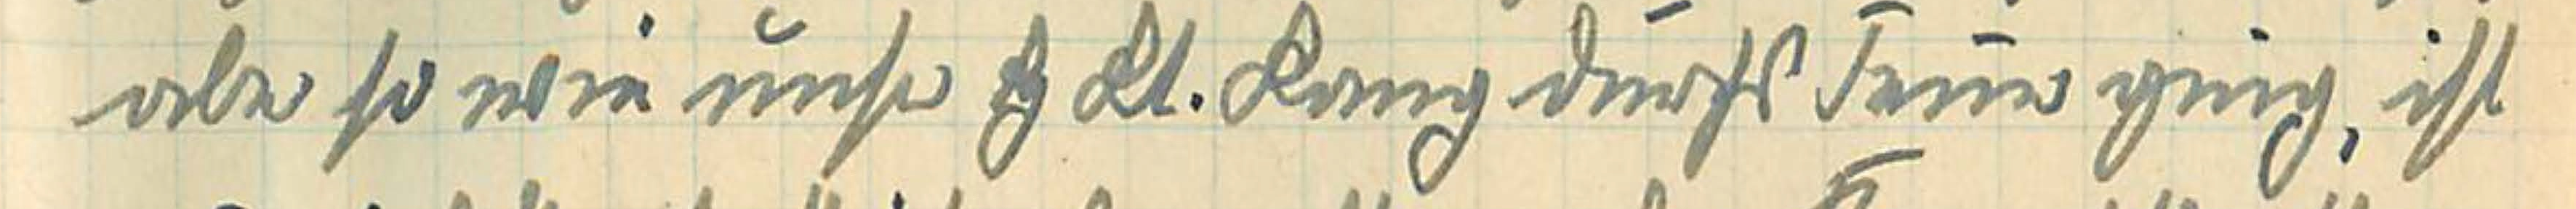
aber so wie unser H Lt. Komp. durchs Feuer ging, ist
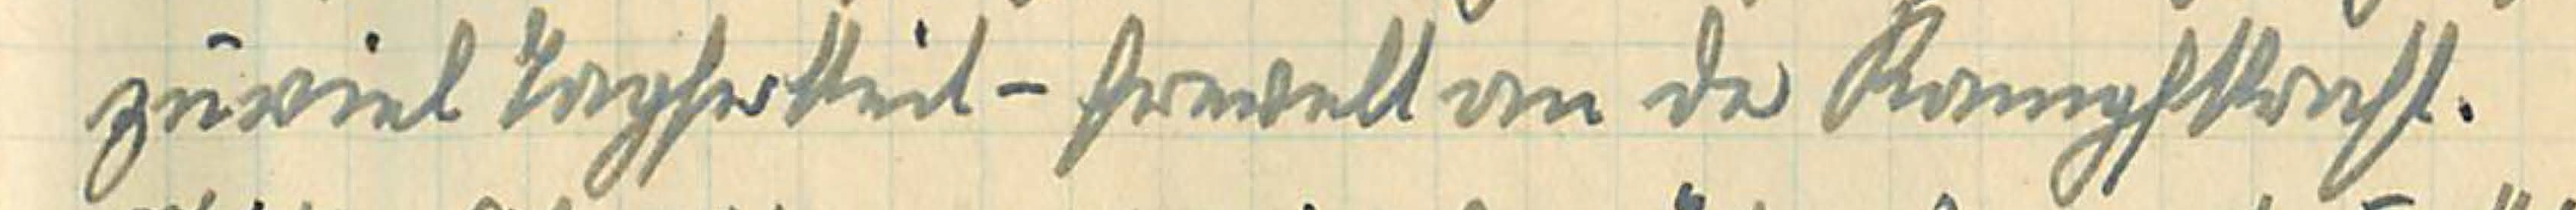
zuviel Tapferkeit – frevelt an der Kampfkraft.
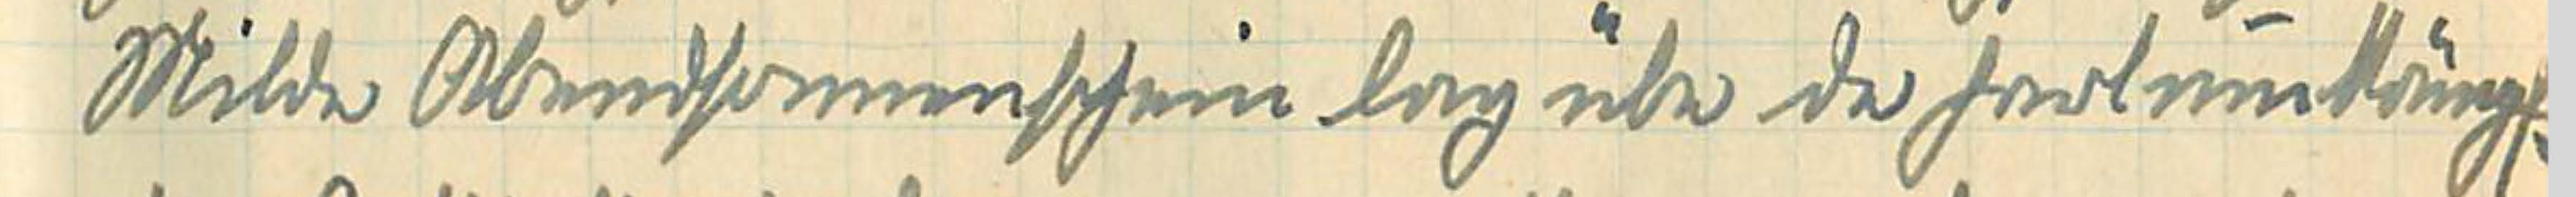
Milder Abendsonnenschein lag über der hartumkämpf-
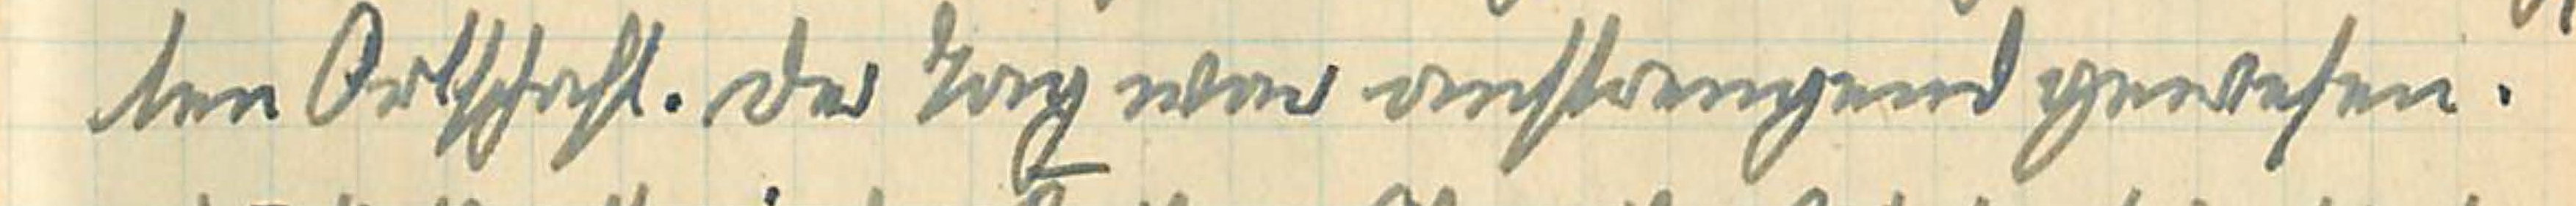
ten Ortschaft. Der Tag war anstrengend gewesen.
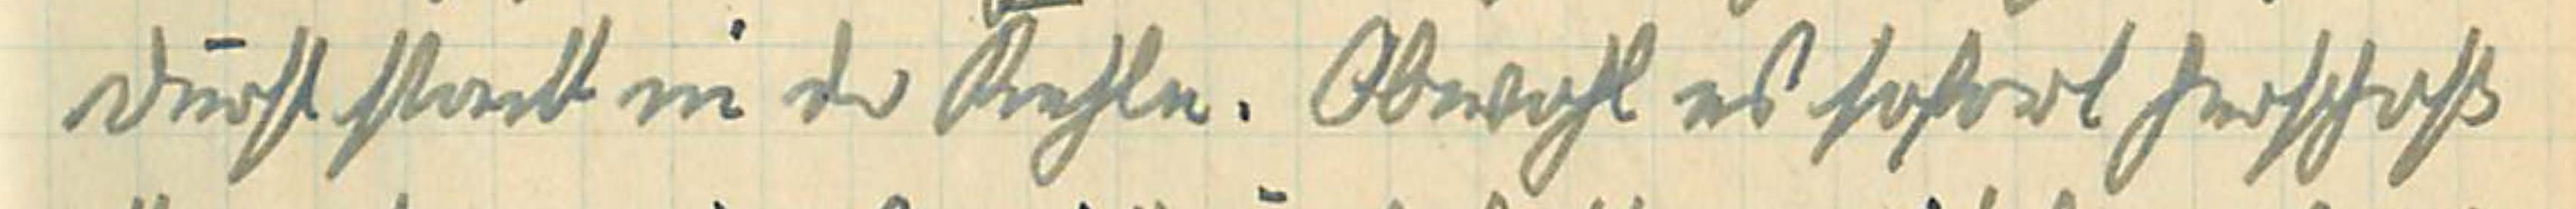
Durst stack in der Kehle. Obwohl es sofort herschoß
